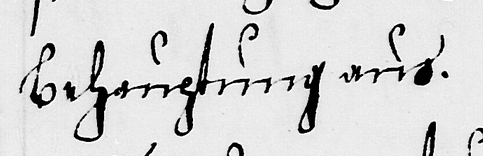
Behauptung aus.
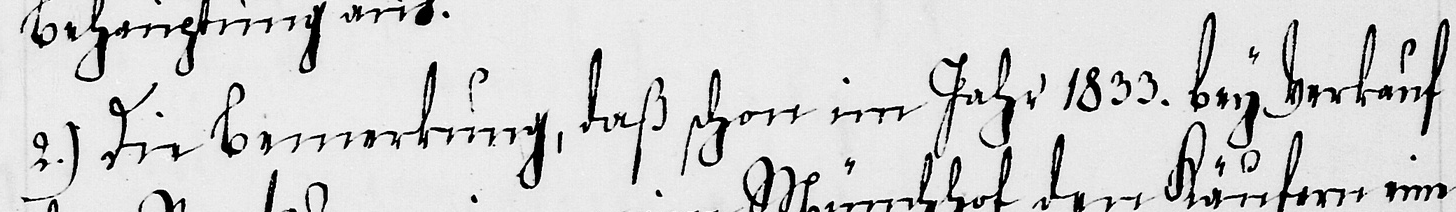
a.) Die Bemerkung, daß schon im Jahr 1833. bey Verkauf
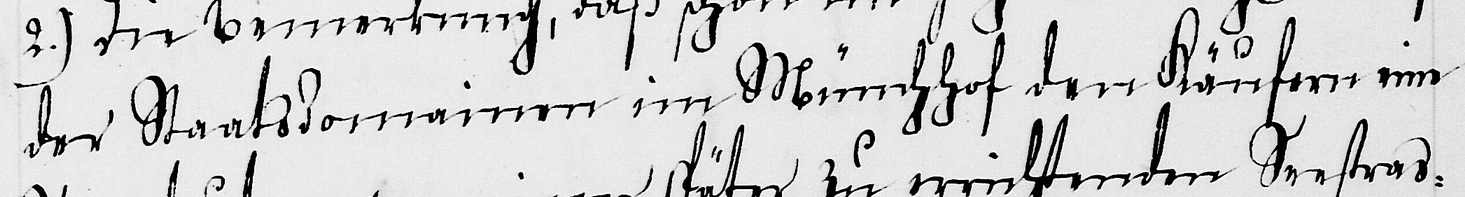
der Staatsdomainen im Münchhof den Käufern eine
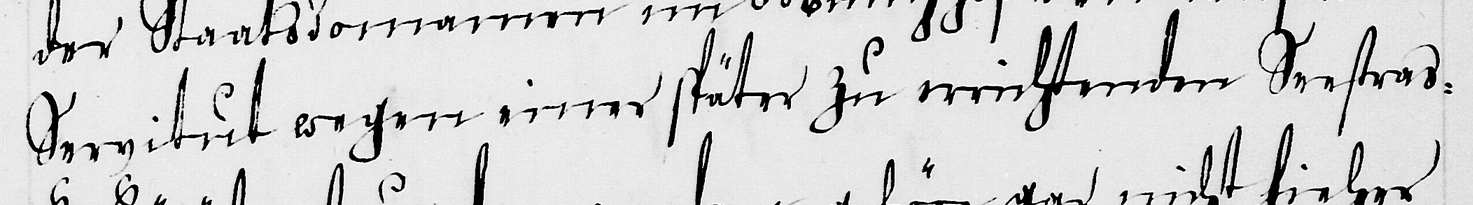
Servitut wegen einer später zu errichtenden Seestras¬
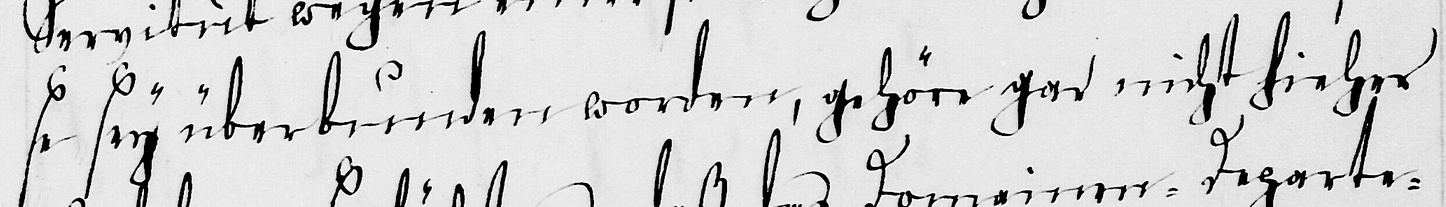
se sey überbunden worden, gehöre gar nicht hieher
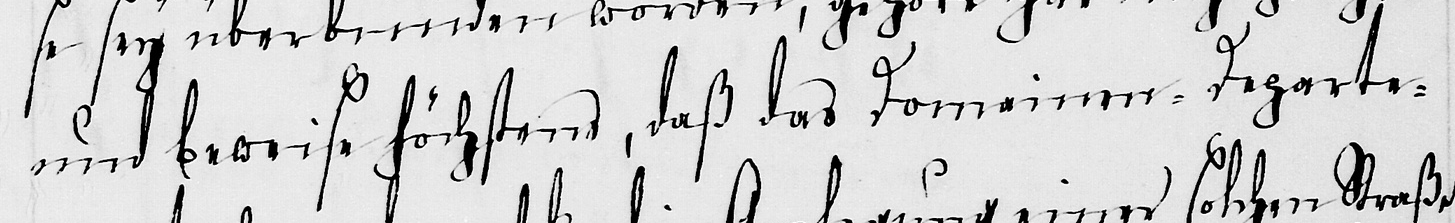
und beweise höchstens, daß das Domainen-Departe¬
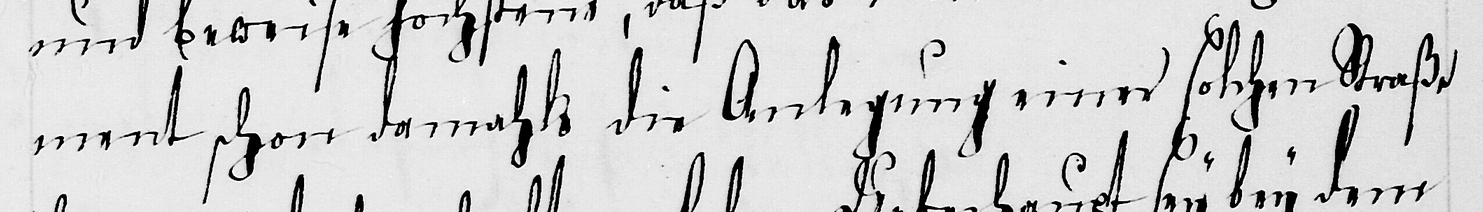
ment schon damahls die Anlegung einer solchen Straße
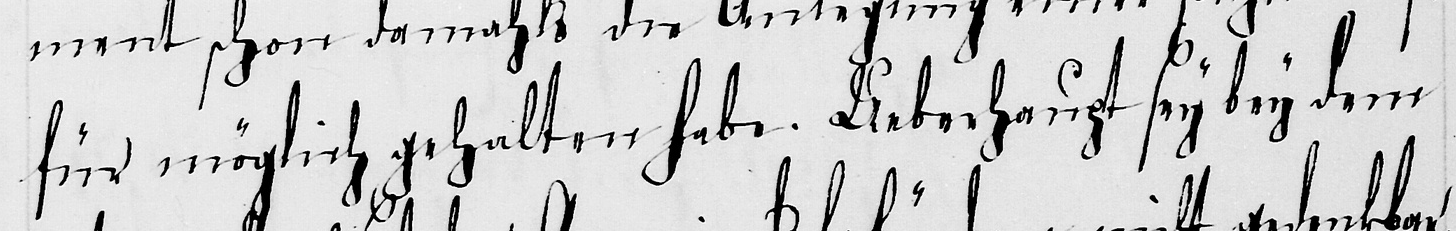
für möglich gehalten habe. Ueberhaupt sey bey dem
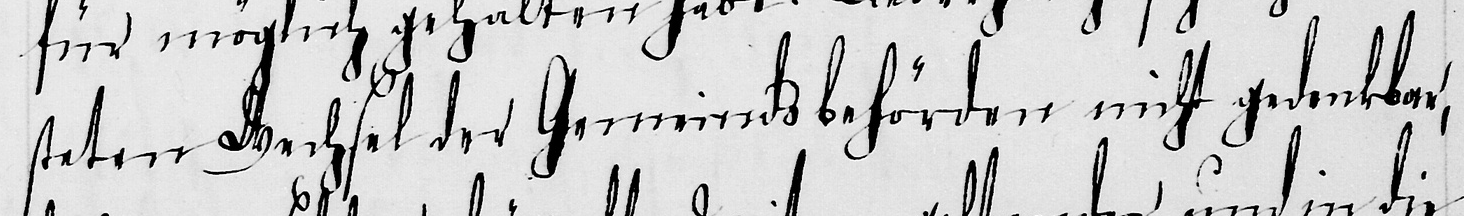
steten Wechsel der Gemeindsbehörden nicht gedenkbar,
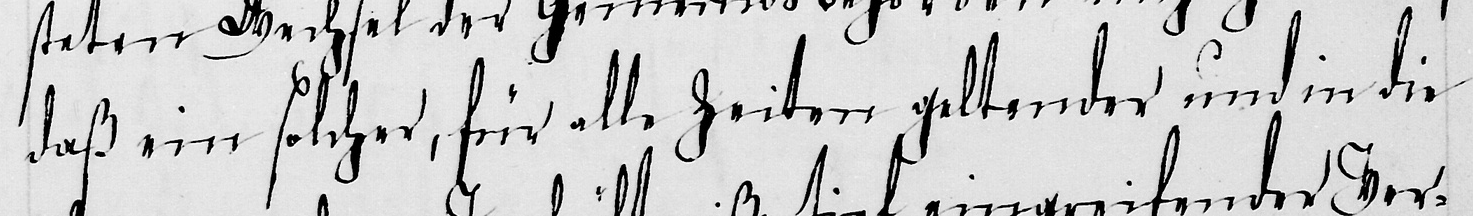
daß ein solcher, für alle Zeiten geltender und in die
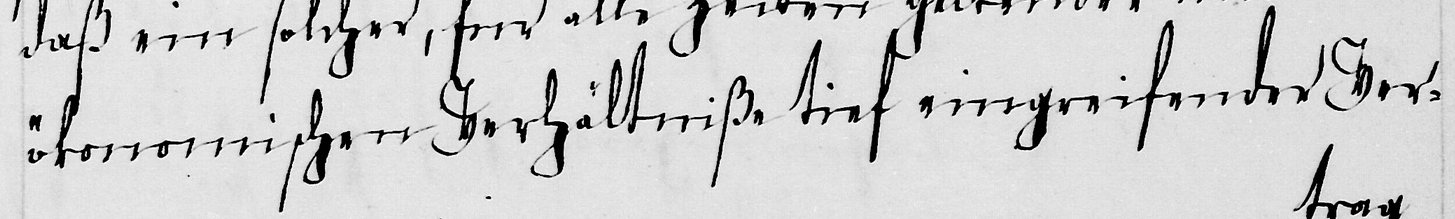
ökonomischen Verhältniße tief eingreifenden Ver-
